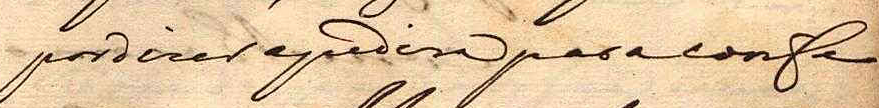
por dizer a pedira para confe
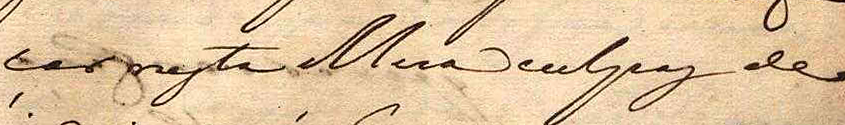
çar nesta Meza culpas de
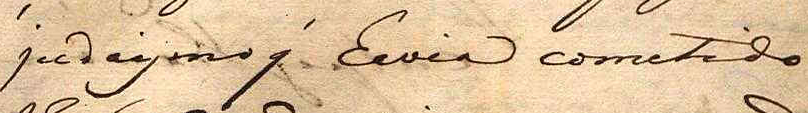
judaismo q̄ havia cometido
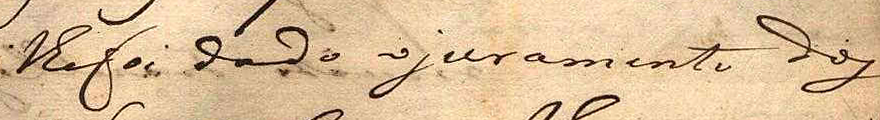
lhe foi dado o juramento dos
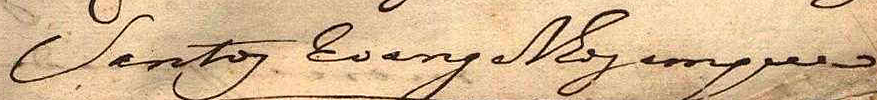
Santos Evangelhos em que
